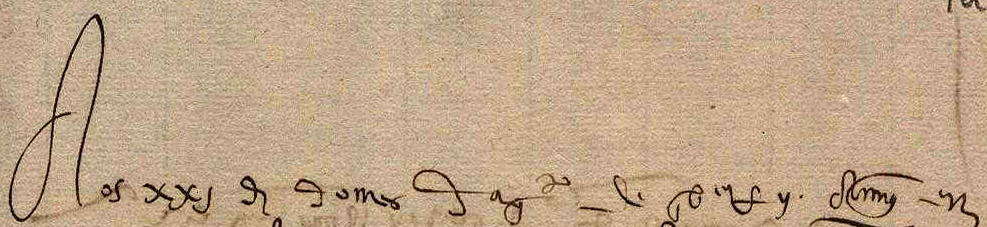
Aos xxj dj do mes dagto de j̄bcRij. Annꝯ em
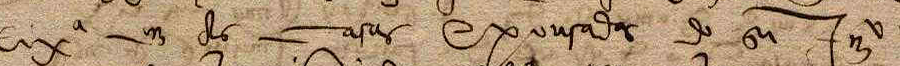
lxa em As casas e pousadas do s̄or Jom
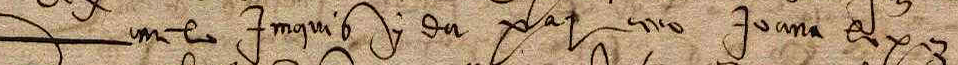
de melo Jmquisydor pareceo Joana lopez
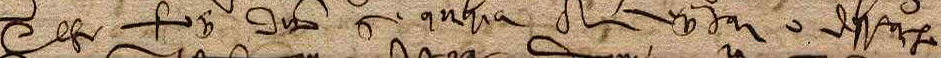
e lhe foy dito se queria Aceytar o despacho
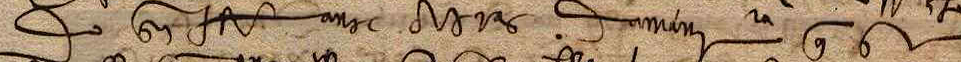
do s̄or Jffante Atras da manrra q̄ se
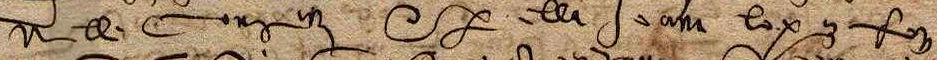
nele contem e ꝑ ella Joana lopez foy
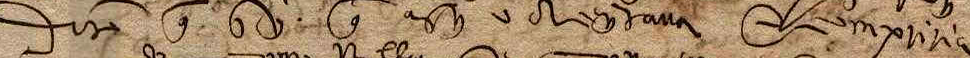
dito q̄ sy q̄ asy o Aceytaua e compriria
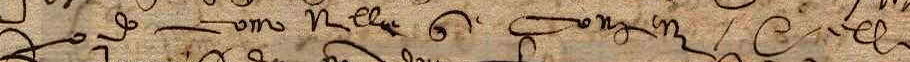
todo como nelle se contem / e elle
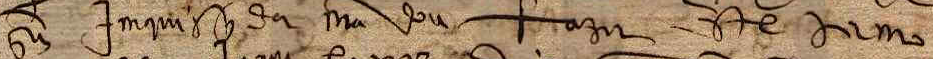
s̄or Jmquisydor mādou fazer este termo
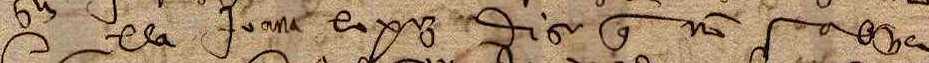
e ella Joana lopez dise q̄ nō sabya
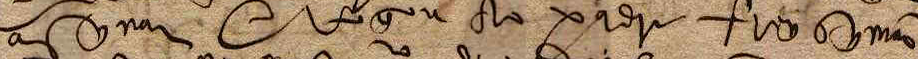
asynar e Rogou Ao padre frey symão
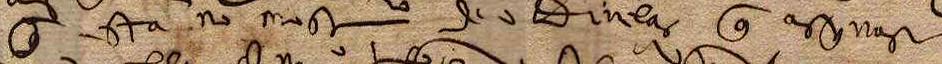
q̄ esta no mostro de odiuelas q̄ asynase
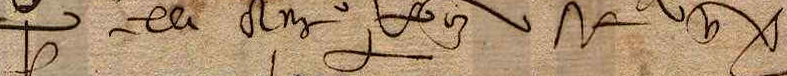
p̄o ella Anto Rōiz o spivy
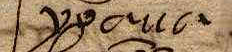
yoana
